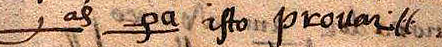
tas ꝑa isto prouar /./.
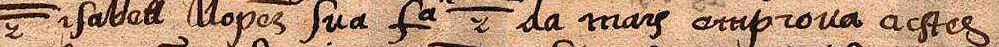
item isabell llopez sua fa item da mais em proua a estes
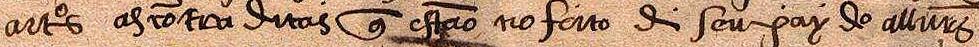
artos as c̄otraditas q̄ estão no feito de seu pay do allur̄z
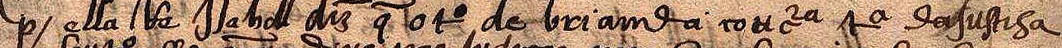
P/ ella Re Jsabell dīz q̄ o to de briamda coucra ta da Justisa
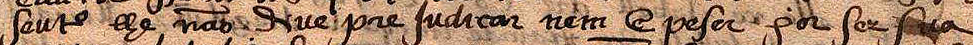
seu to lhe não deue preJudicar nem ēpeser por ser sua
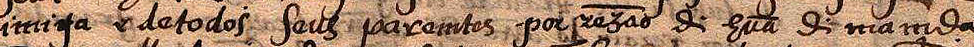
imiga e de todos seus paremtes por rezão de hūa demamda
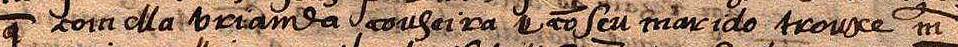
q̄ com ella briamda couseira e c̄o seu marido trouxe mte
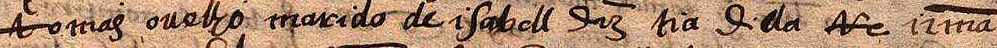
tomas o uelho marido de isabell dīz tia della Re irmā
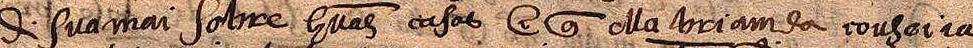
de sua mai sobre hūas casas ē q̄ ella briamda couseira
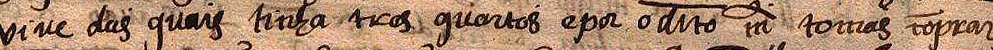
viue das quais tinha tres quartos e por o dito mte tomas c̄oprar
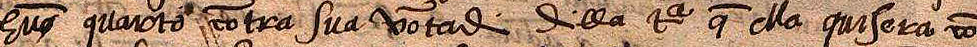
hūo quarto c̄otra sua vōtade della ta q̄ ella quisera c̄o
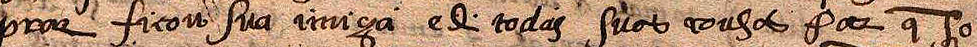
prar ficou sua imiga e de todas suas cousas porq̄ so
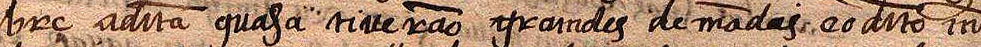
bre a dita quasa tiuerão gramdes dem̄adas e o dito mte
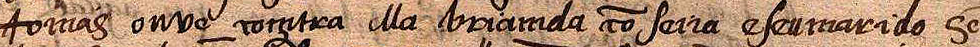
tomas ouve comtra ella briamda c̄oseira e seu marido sē
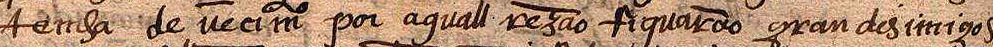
temsa de ūecimto por a quall rezão fiquarão grandes imigos
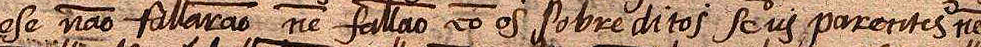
e se não fallarão n̄e fallão c̄o os sobreditos seus parentes n̄e
